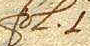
fol. i
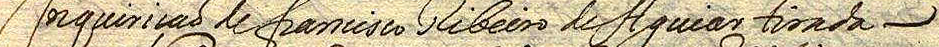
Jnquiriçaõ de francisco Ribeiro de Aguiar tirada -
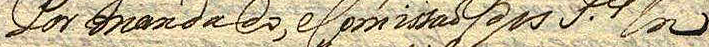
Por mandado, e Com̄issaõ dos S.res In
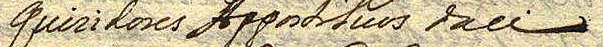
quizidores Appostolicos da ci
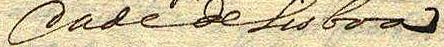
dade de Lisboa
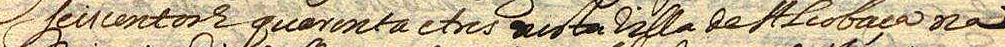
seiscentos E quarenta e tres nesta villa de Alcobaça na
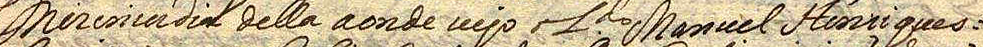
Mizericordia della aonde uejo o L.do Manuel Henriques
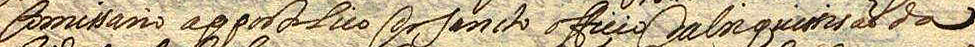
Comissario appostolico do Sancto offiçio da Inquissisaõ da
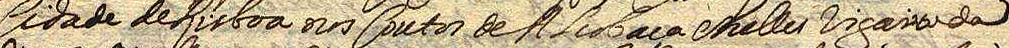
Cidade de Lisboa nos Coutos de Alcobaça e nelles vigairo da
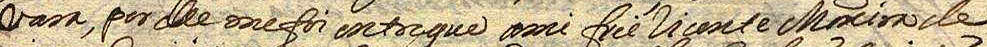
vara, por elle me foi entregue a mi frei Vicente Moreira cle
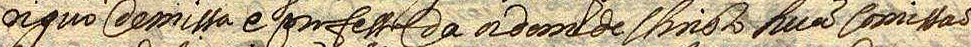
riguo de missa e Confessor da ordem de Christo huā Comissaõ
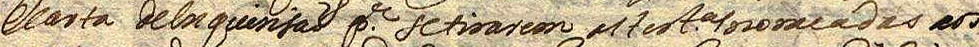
e carta de Inquisisaõ p.a se tirarem as test.as nomeadas aos
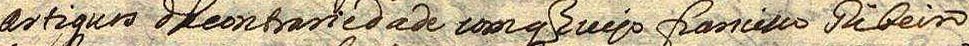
artiguos da contrariedade com q̄ uejo francisco Ribeiro
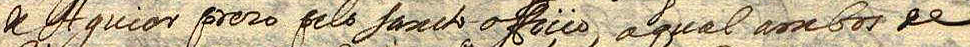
de Aguiar prezo pelo sancto offiçio, o qual ambos de
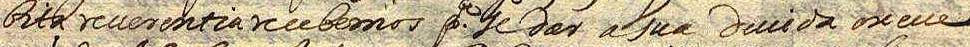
vita reuerentia recebemos p.a se dar a sua deuida execu
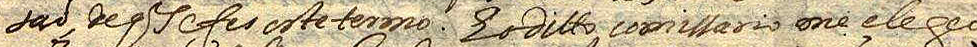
saõ, de q̄ se fes este termo. E o ditto comissario me elegeo
